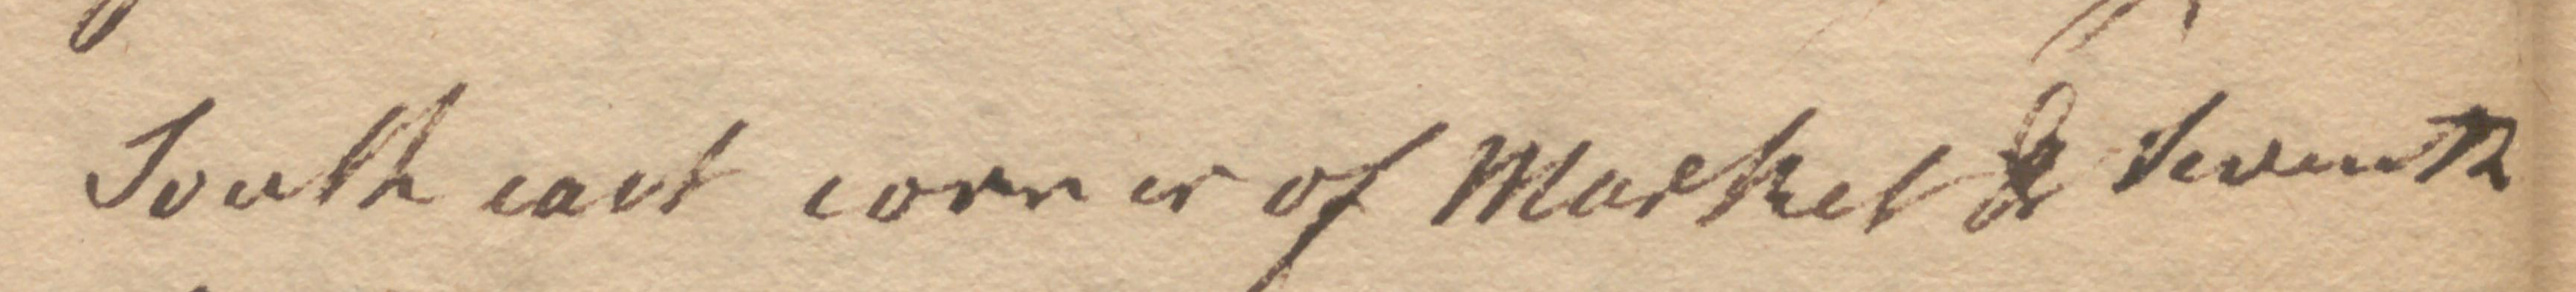south east corner of Market & seventh
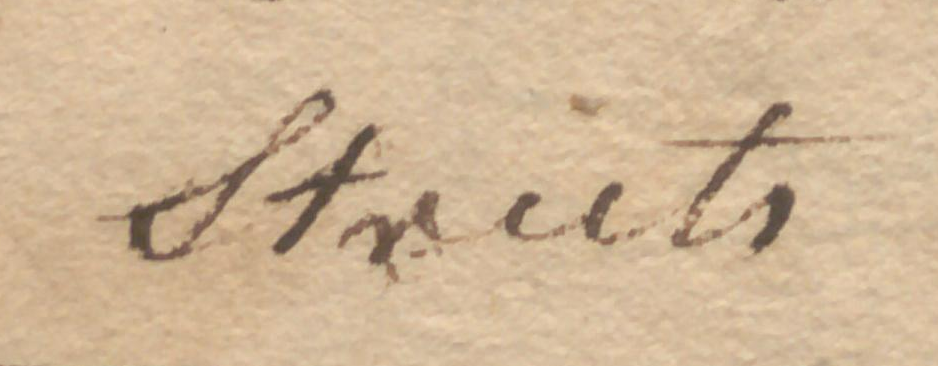Streets
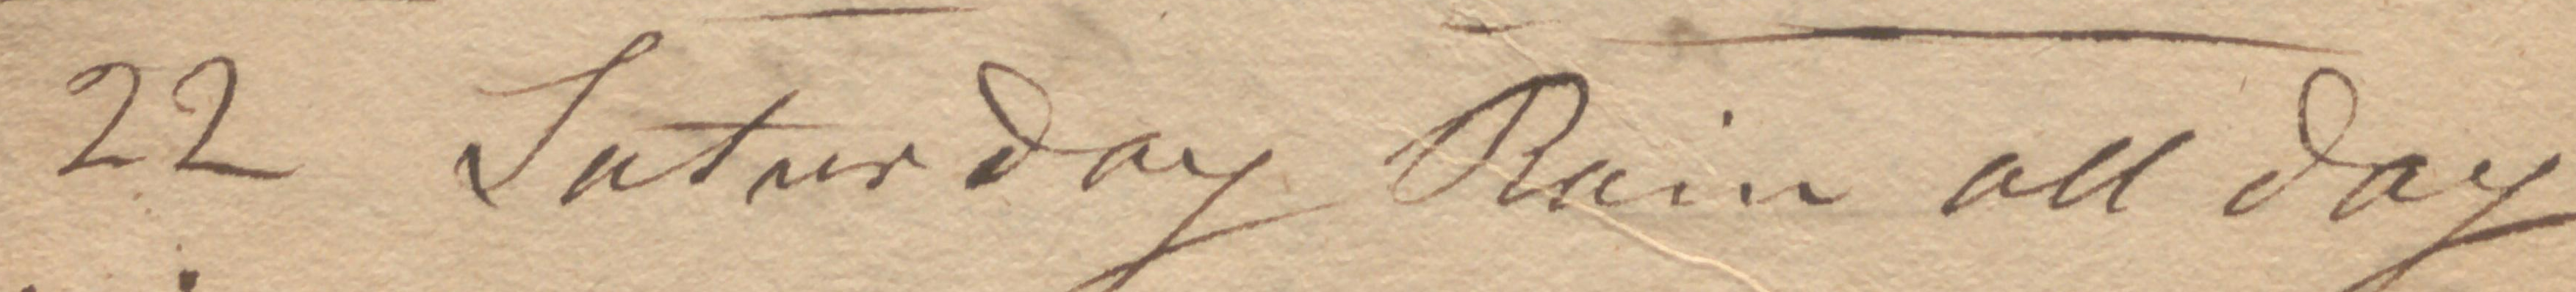22 Saturday Rain all day
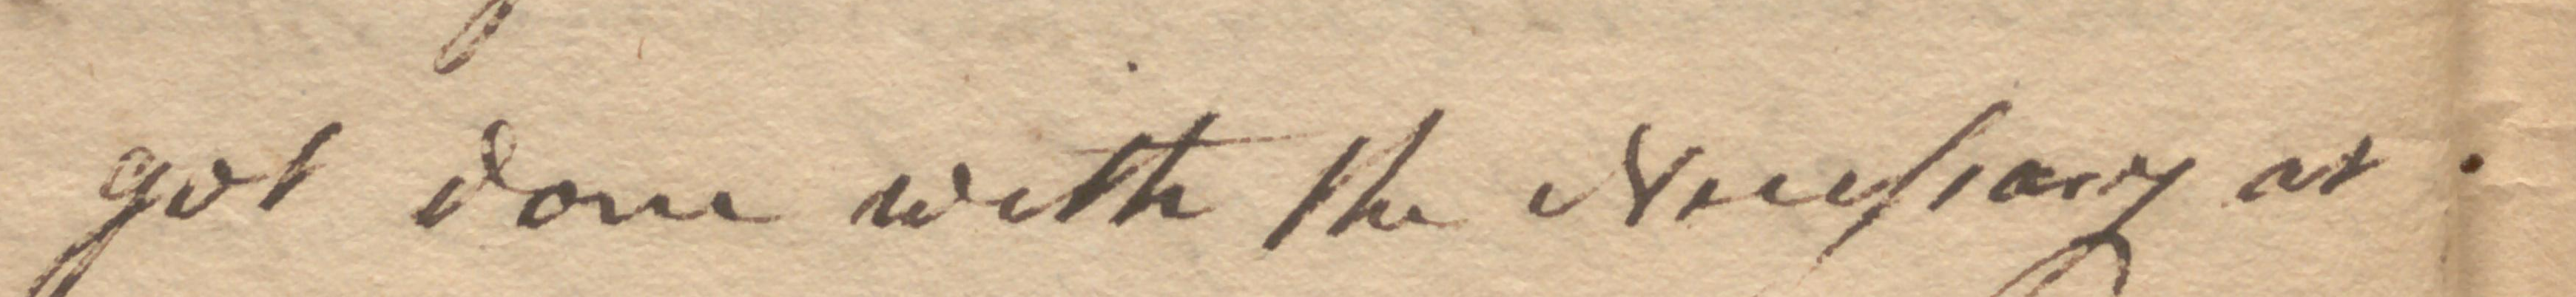got done with the Necessary at.
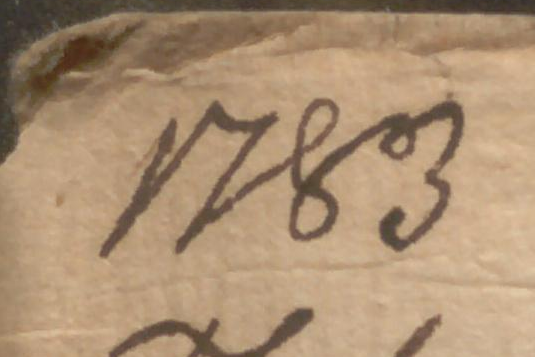1783
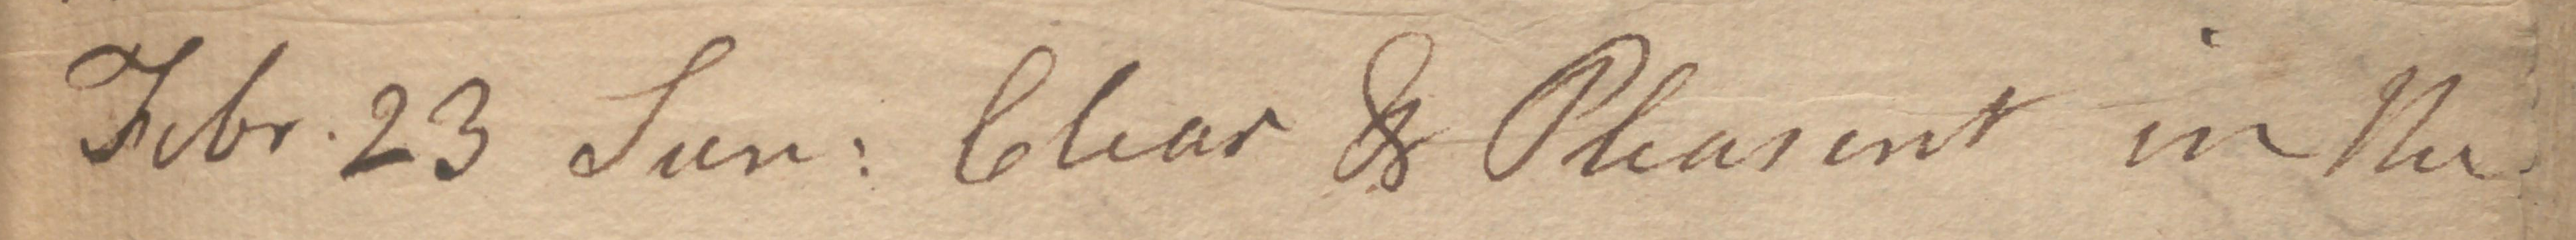Febr 23 Sun: Clear & Pleasent in the
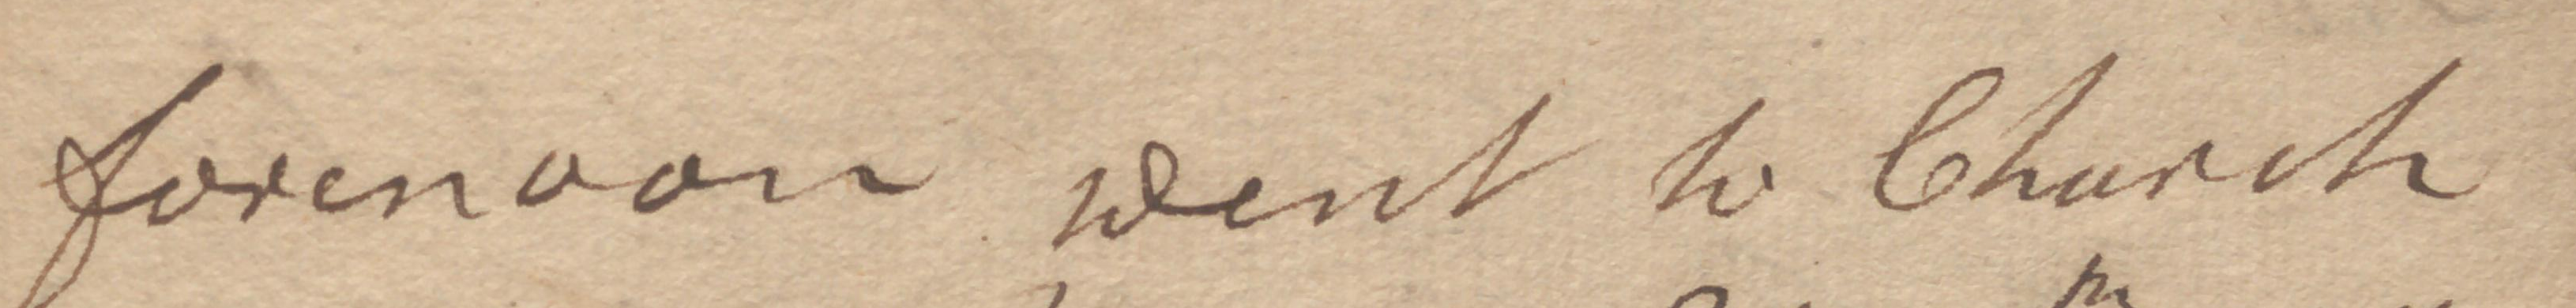forenoon went to Church
